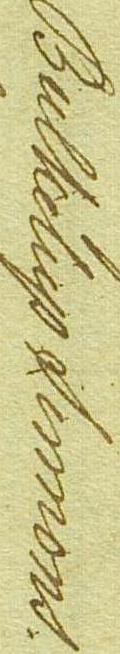Bulkeleys Sermons.
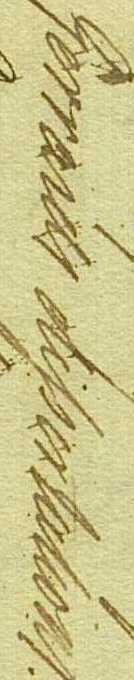Gerrards dissertations.
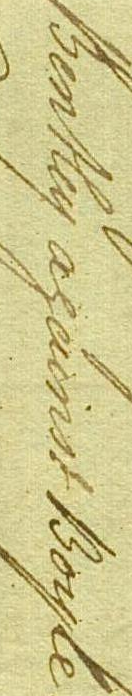Bentley against Boyle.
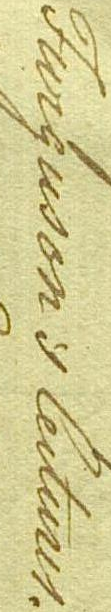Furguson's lectures.
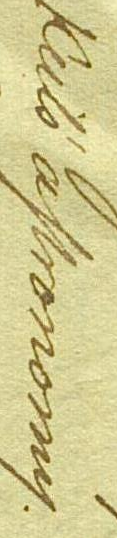Keel's astronomy.
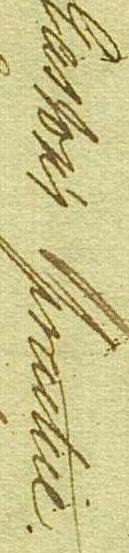Gaston's practice.
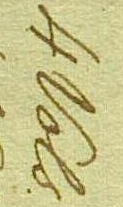4 Vols.
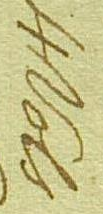4 Vols
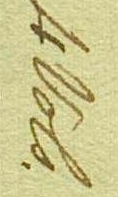4 Vols.
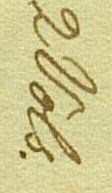2 Vols.
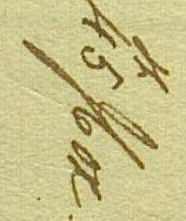45^th JCox
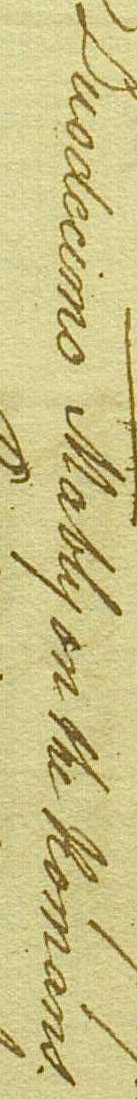Duodecimo Mably on the Romans.
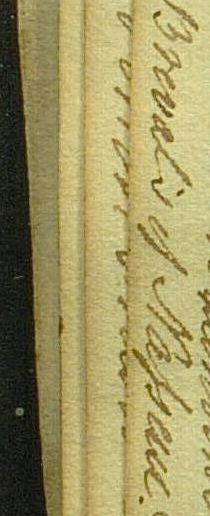Breval's of Nature.
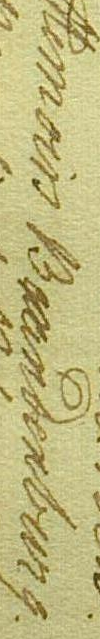Memoirs Brandenburg.
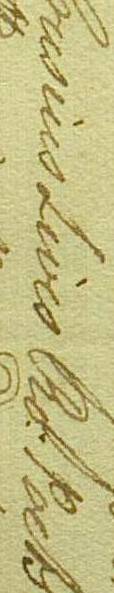Crusius Lives Ro. Poets.
